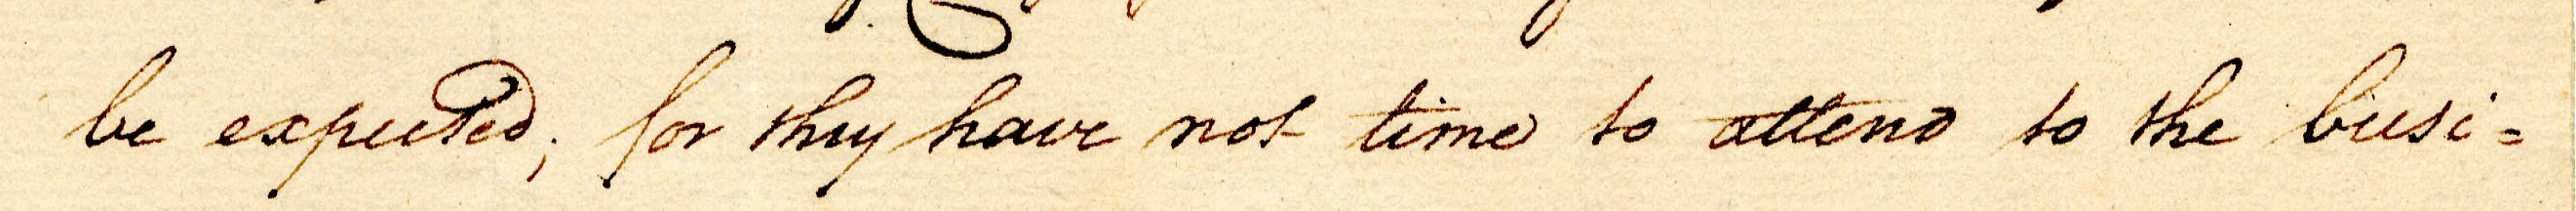be expected; for they have not time to attend to the busi-
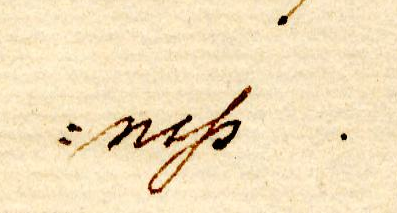-ness.
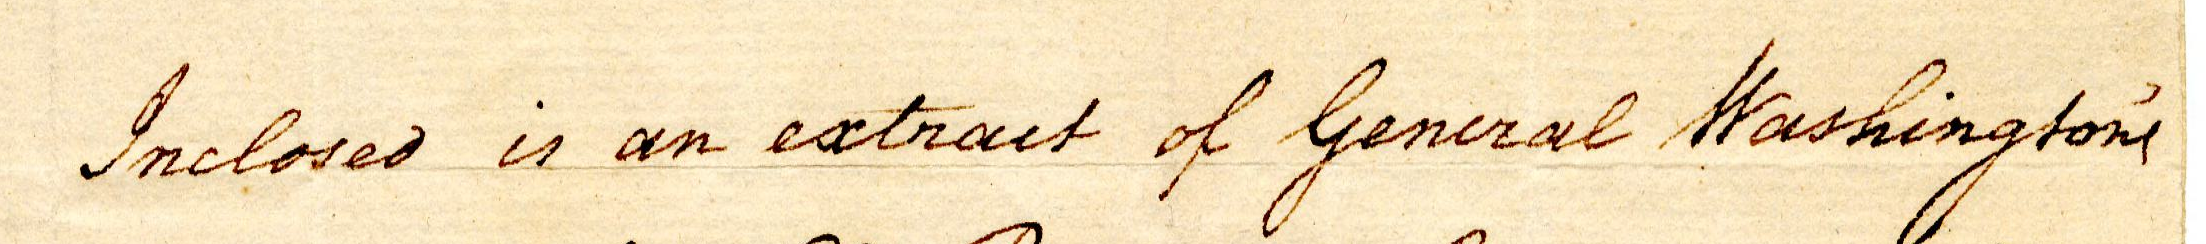Inclosed is an extract of General Washington's
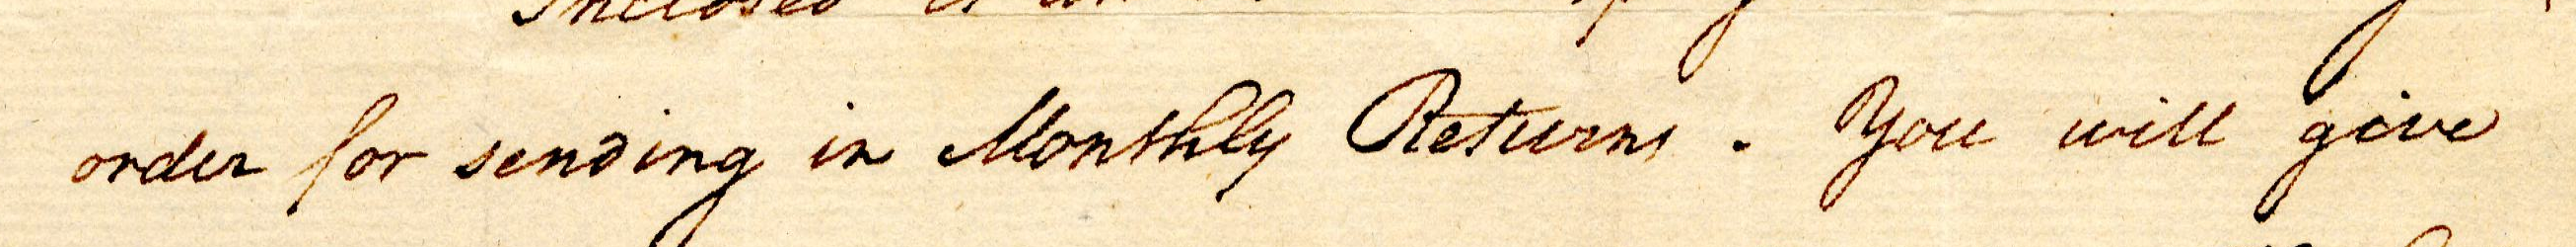order for sending in Monthly Returns. You will give
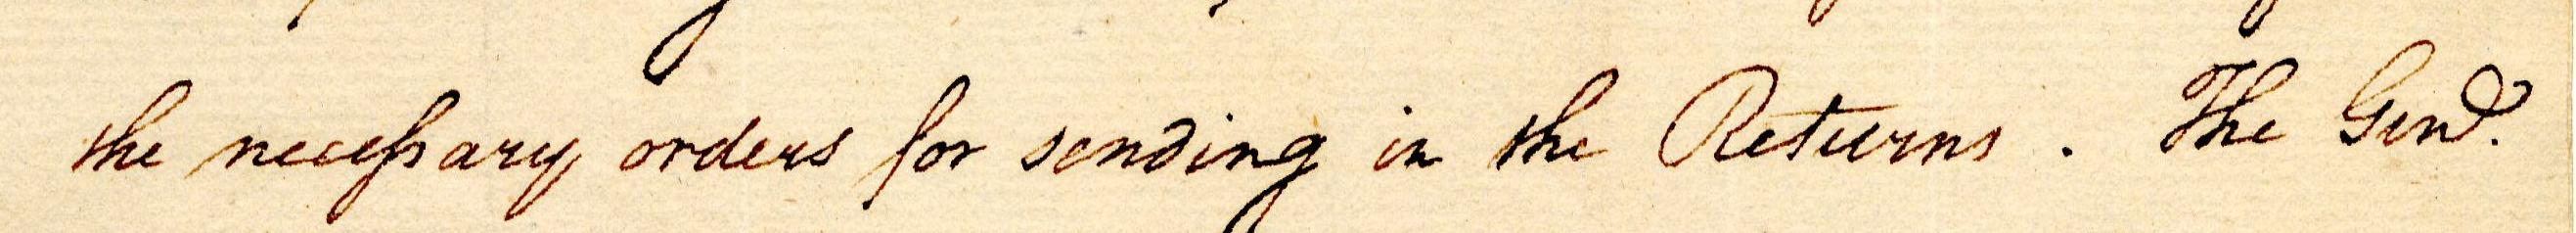the necessary orders for sending in the Returns. The Gen^l.
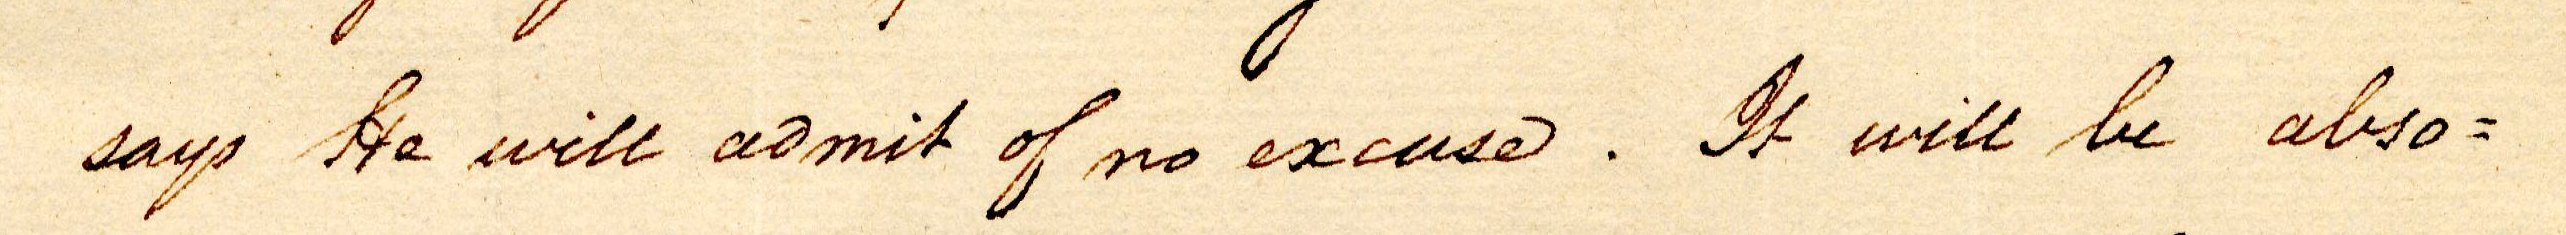says He will admit of no excuse. It will be abso-
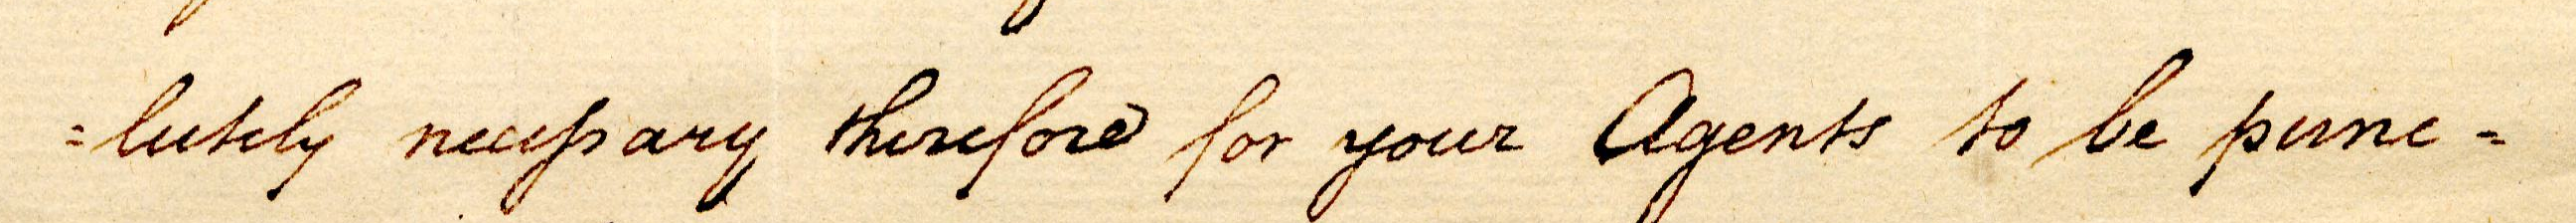-lutely necessary therefore for your Agents to be punc-
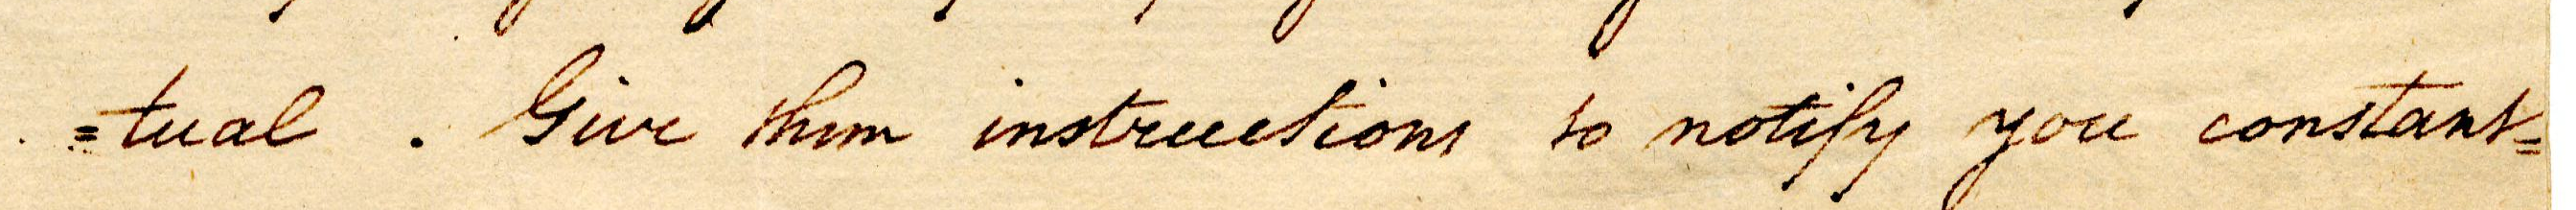-tual. Give them instructions to notify you constant-
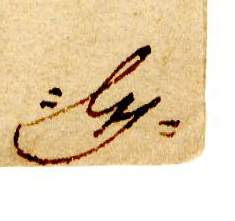-ly-
